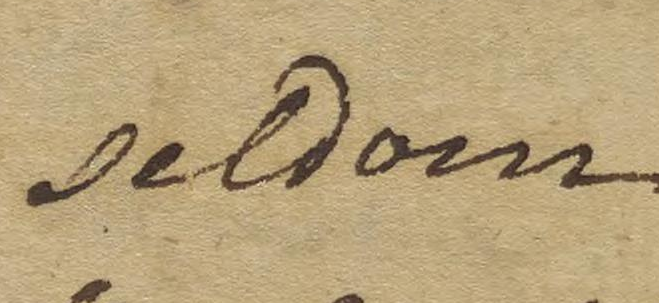seldom
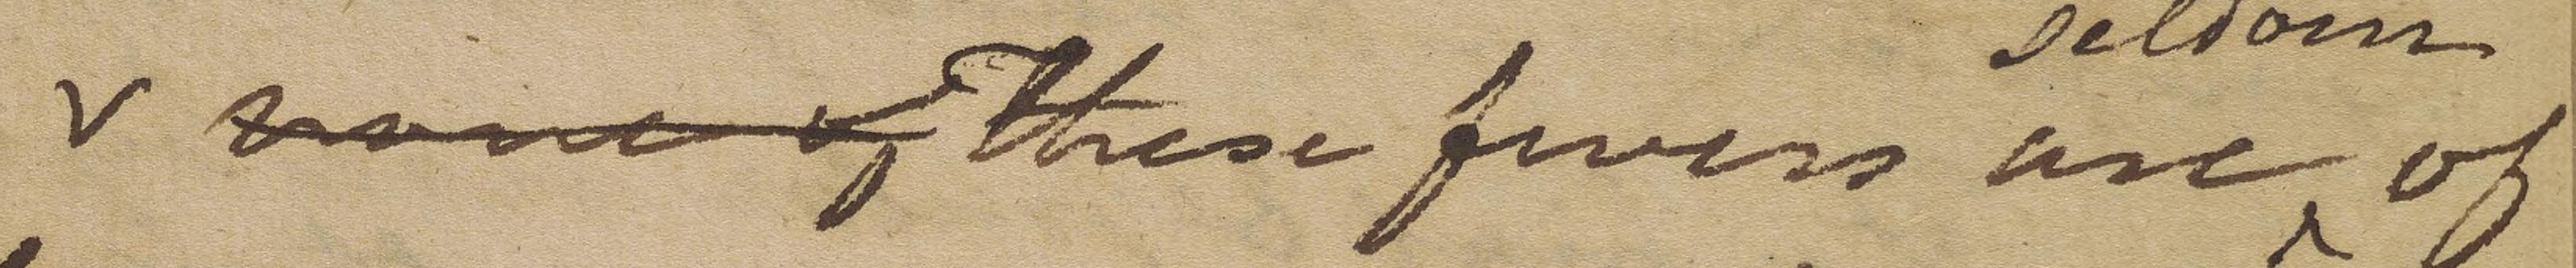V More These fevers are ^ of
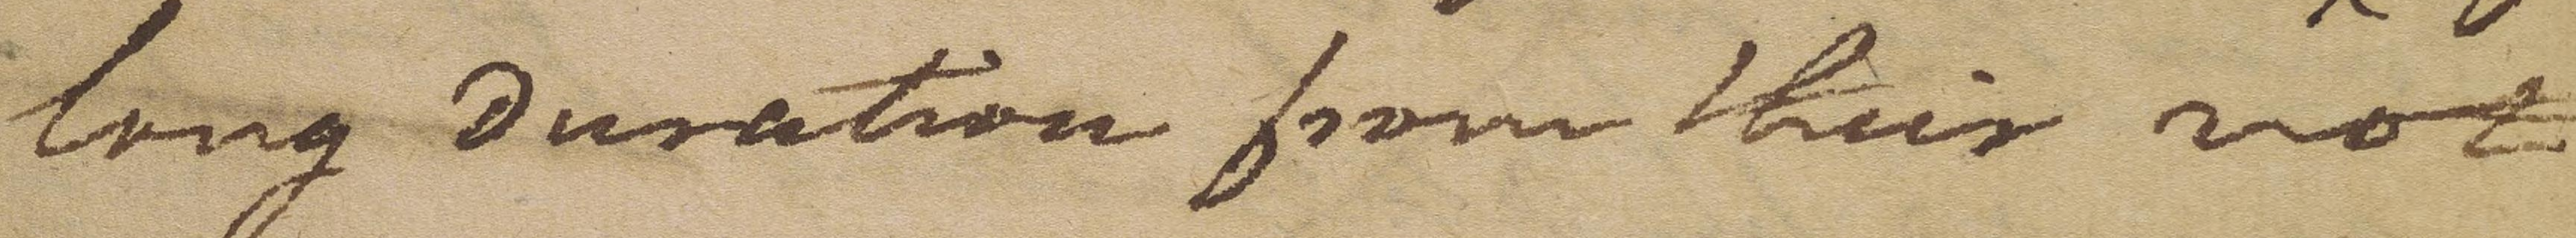long duration from their not
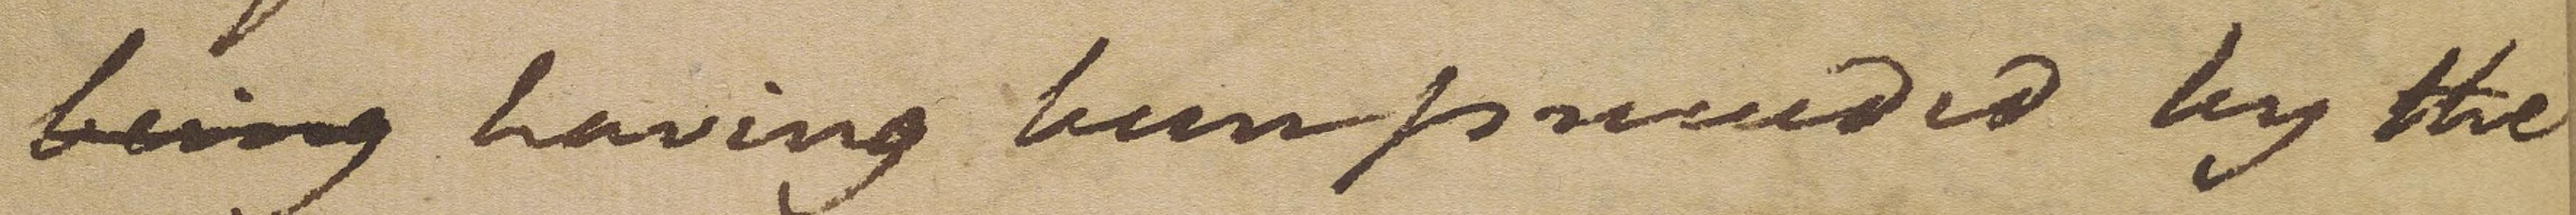being having ben proceeded by the
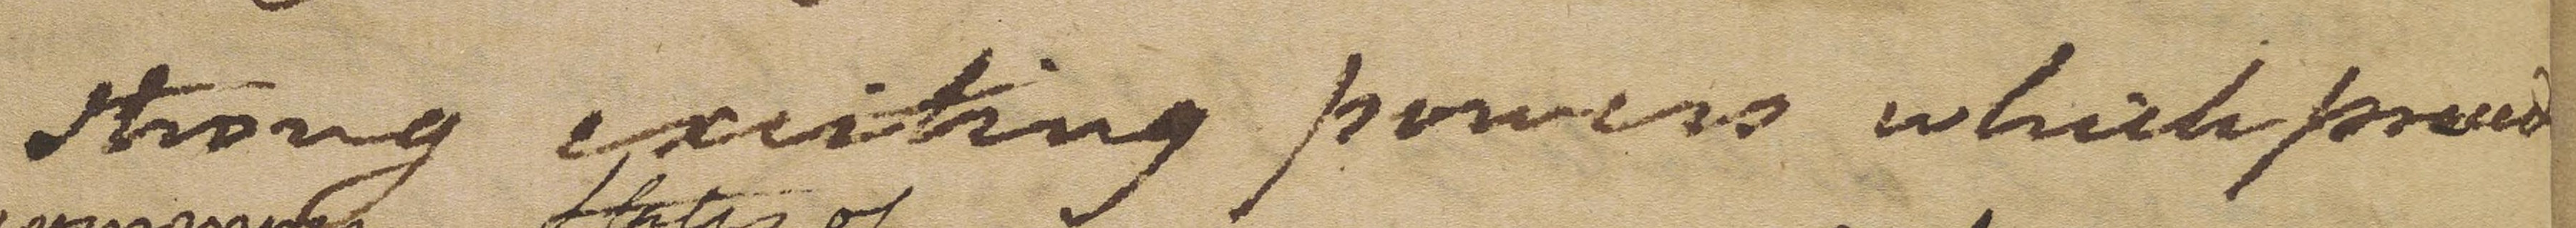strong existing powers which proceed
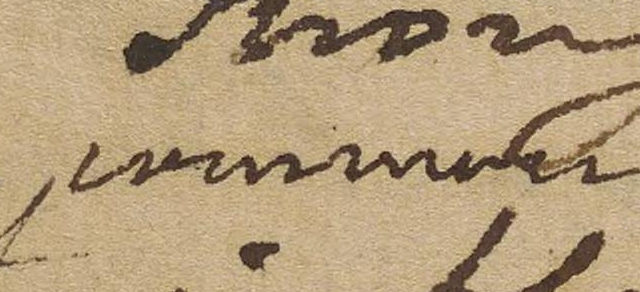common
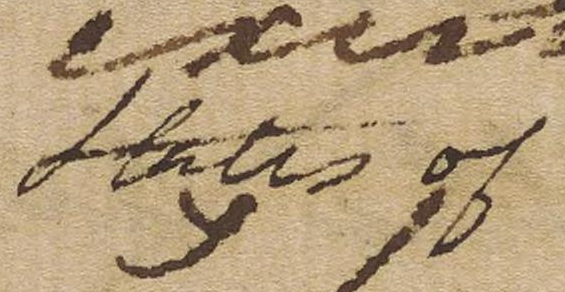states of
